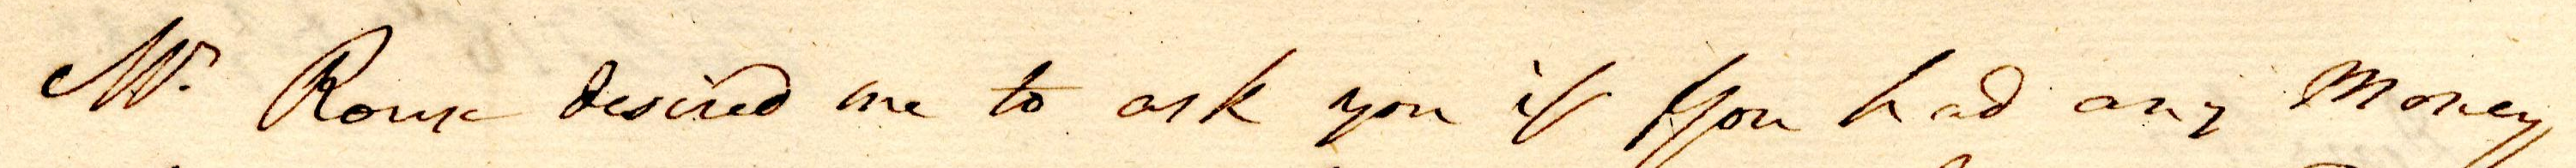M^r. Rouse desired me to ask you if you had any Money
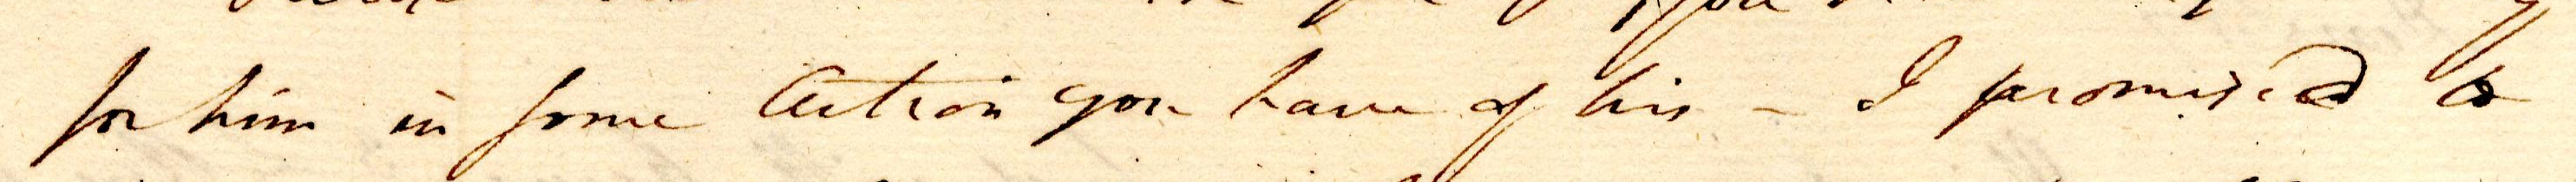for him in some Action you have of his. I promised to
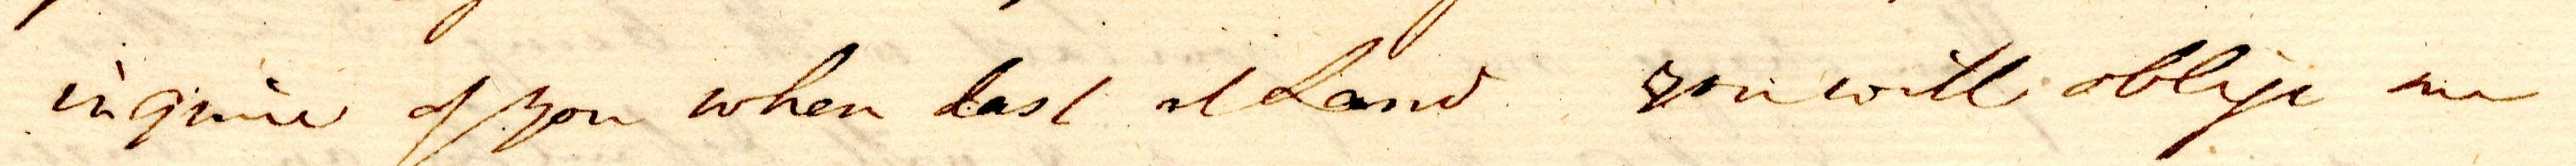inquire of you when last at Land you will oblige me
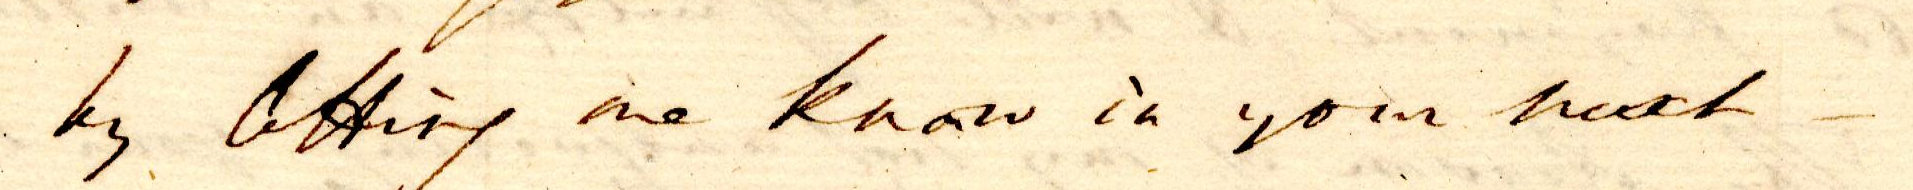by letting me know in your next
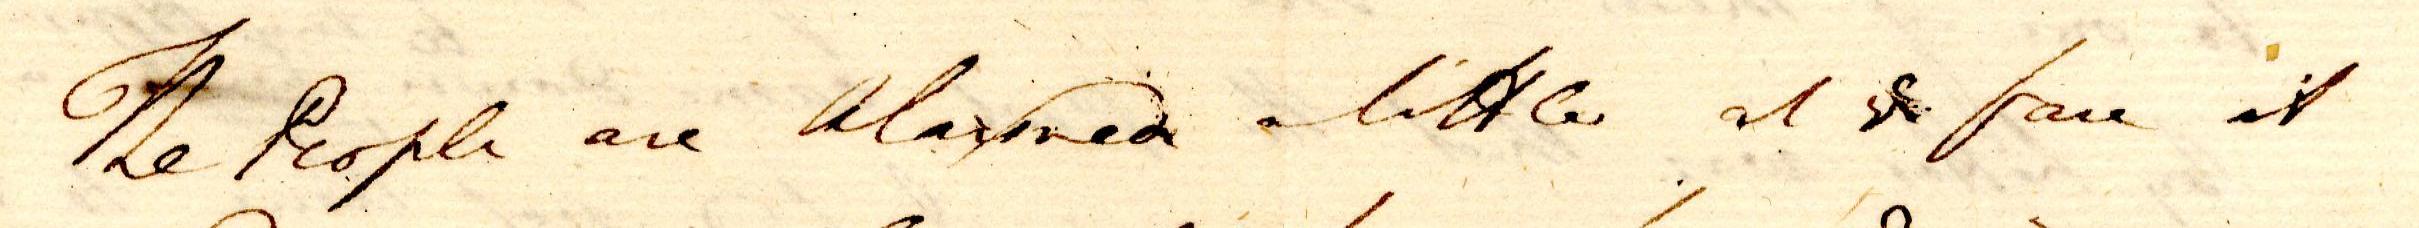The People are Alarmed a little at y^e fare at
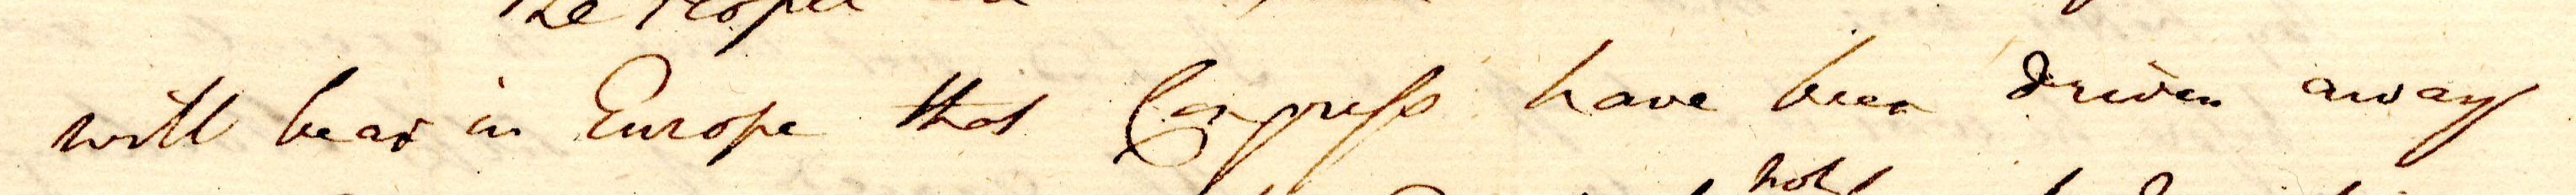will bear in Europe that Congress have been driven away
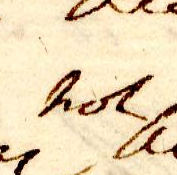not
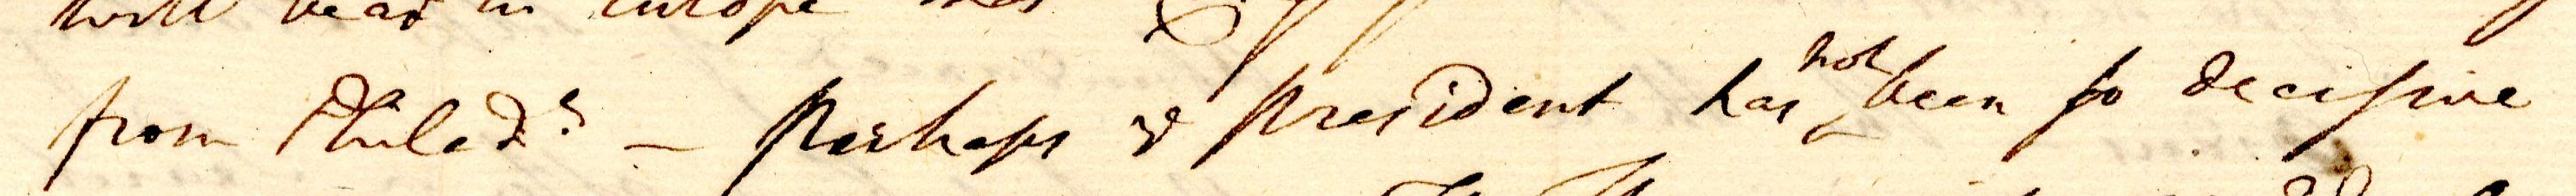from Philad^a: Perhaps y^e president has ^ been so decisive
